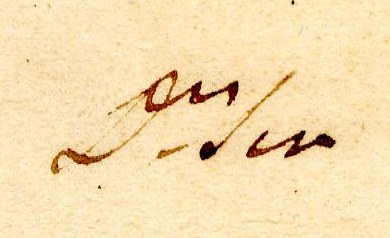D^r Sir
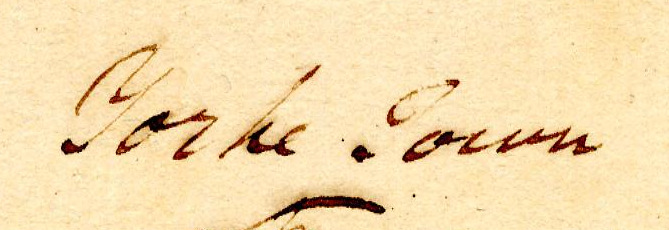Yorke Town
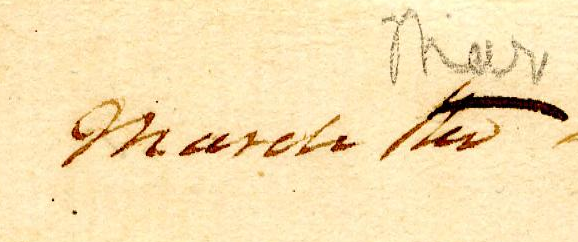March the
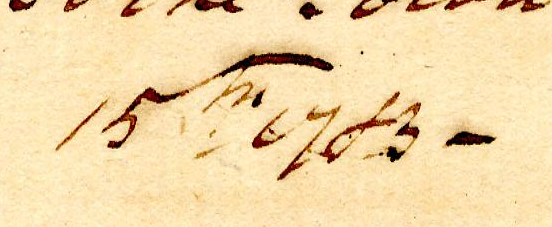15^th 1783
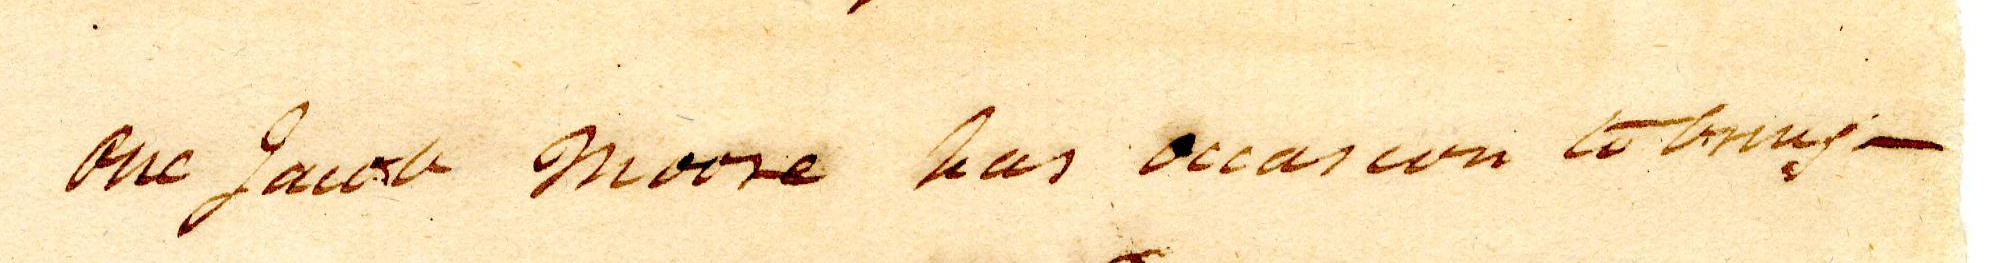one Jacob Moore has occasion to bring
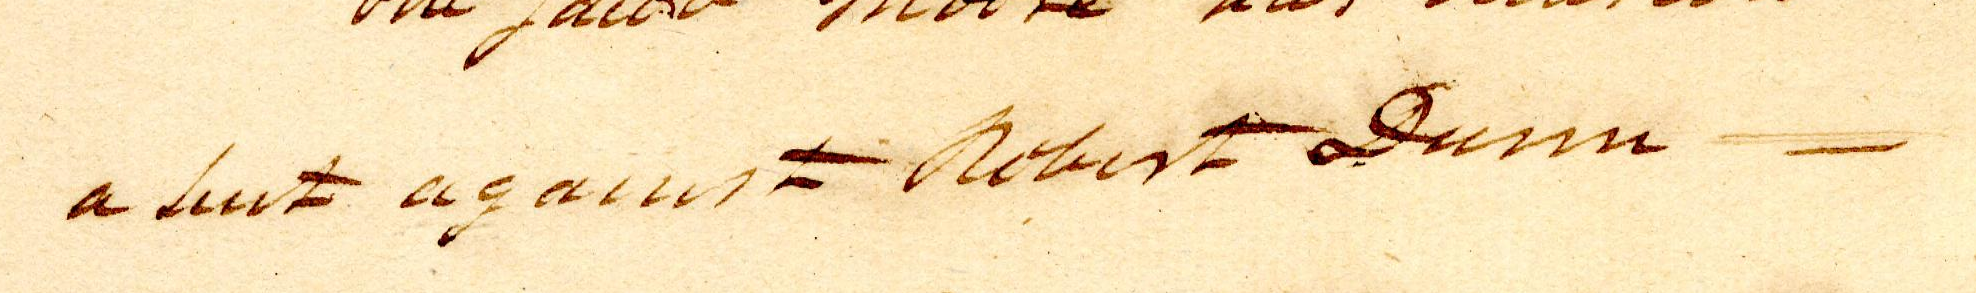a suit against Robert Dunn
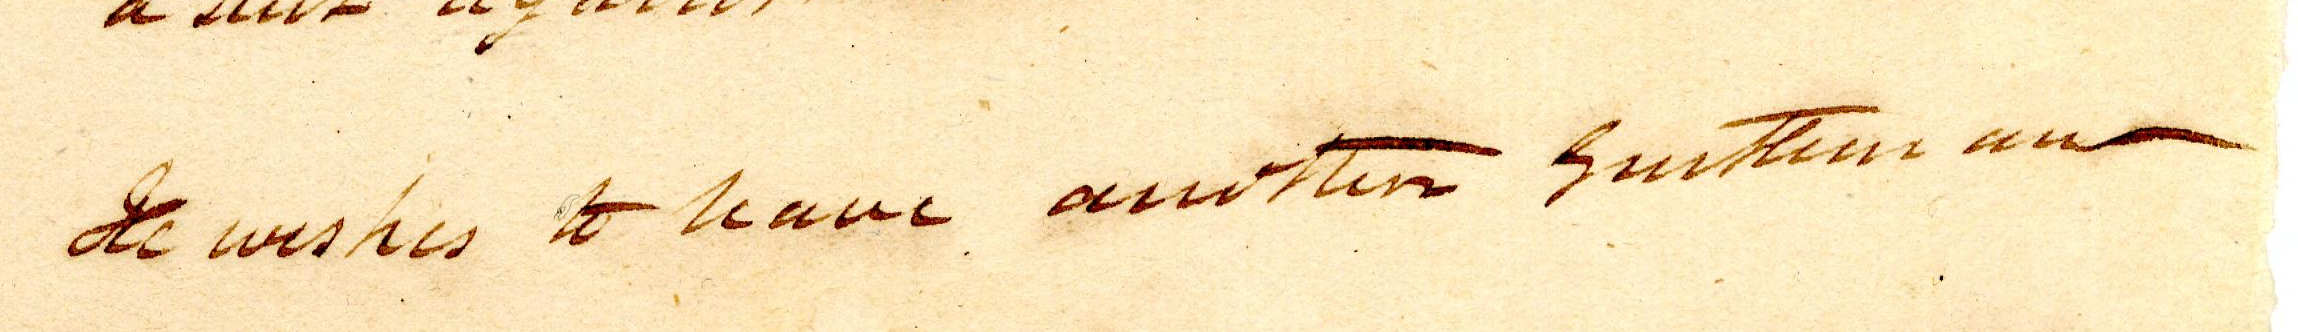He wishes to have another Gentleman
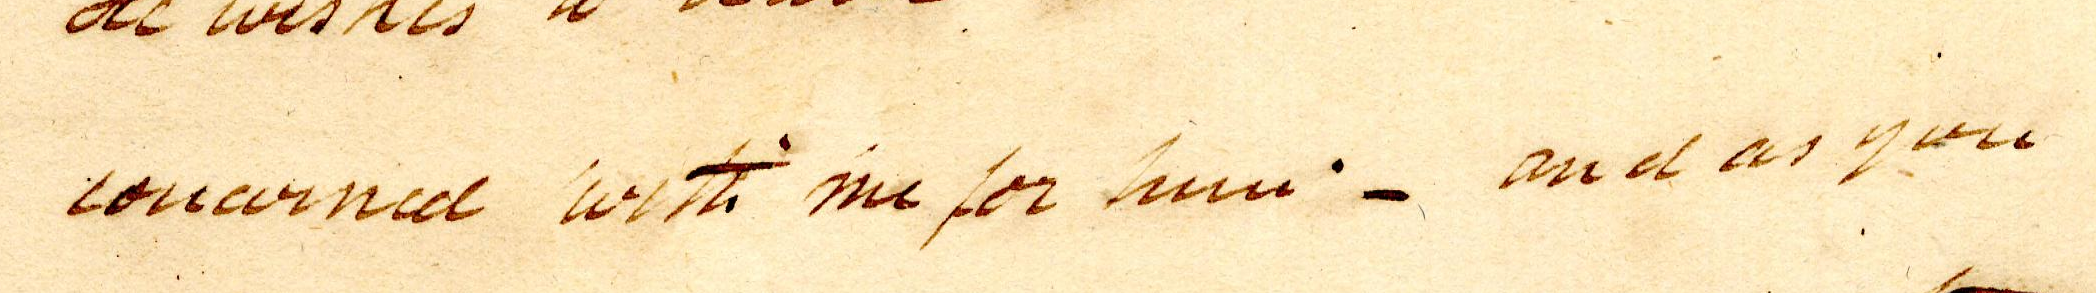concerned with me for him, and as you
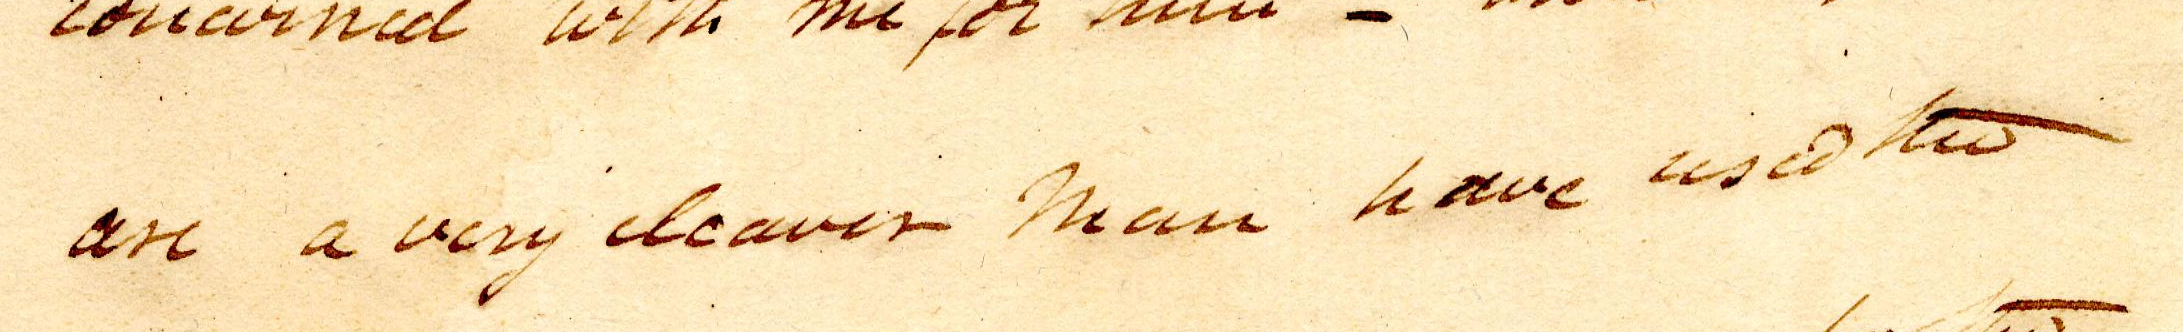are a very cleaver Man have used the
